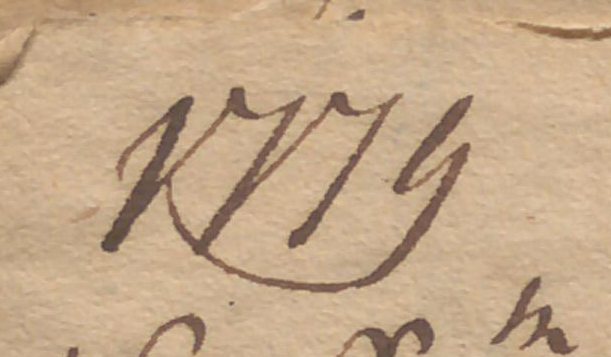1779
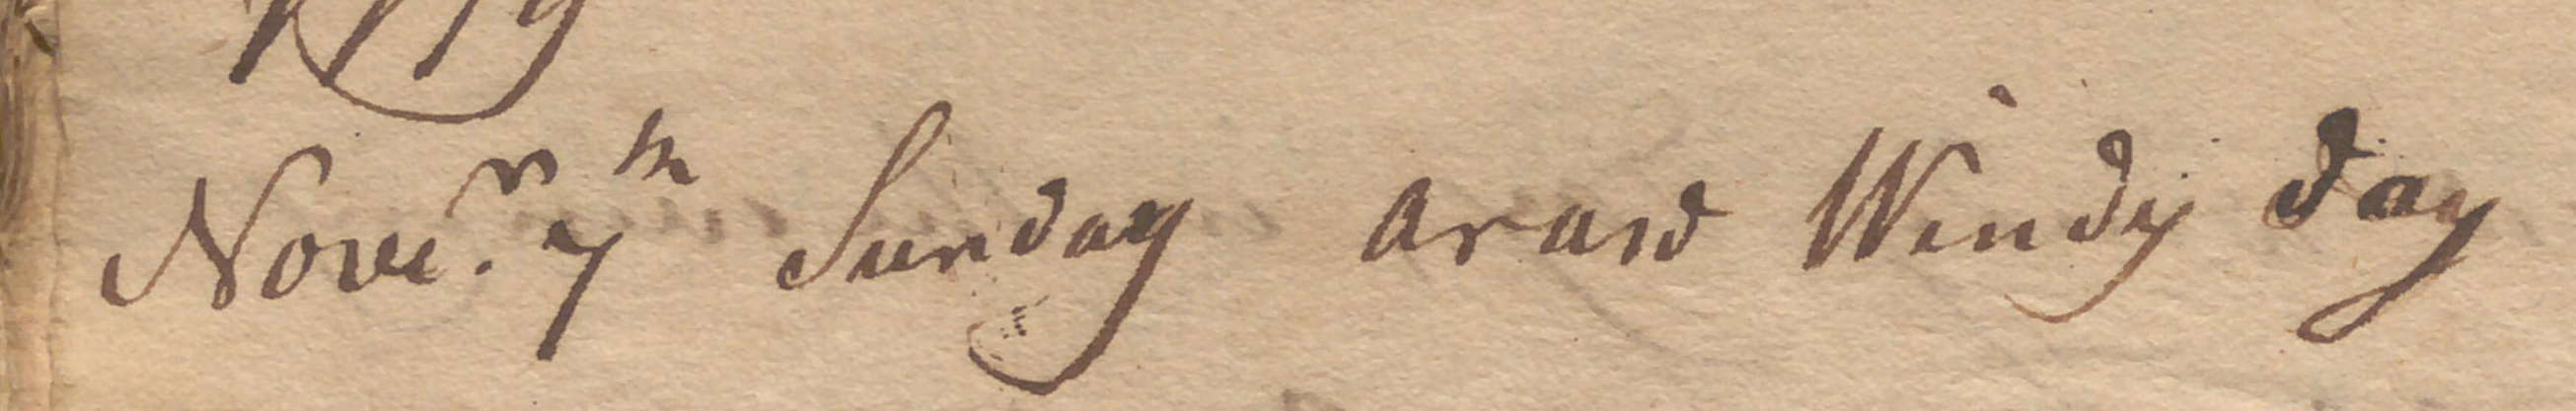Nove^r. 7^th Sunday a raw Windy day
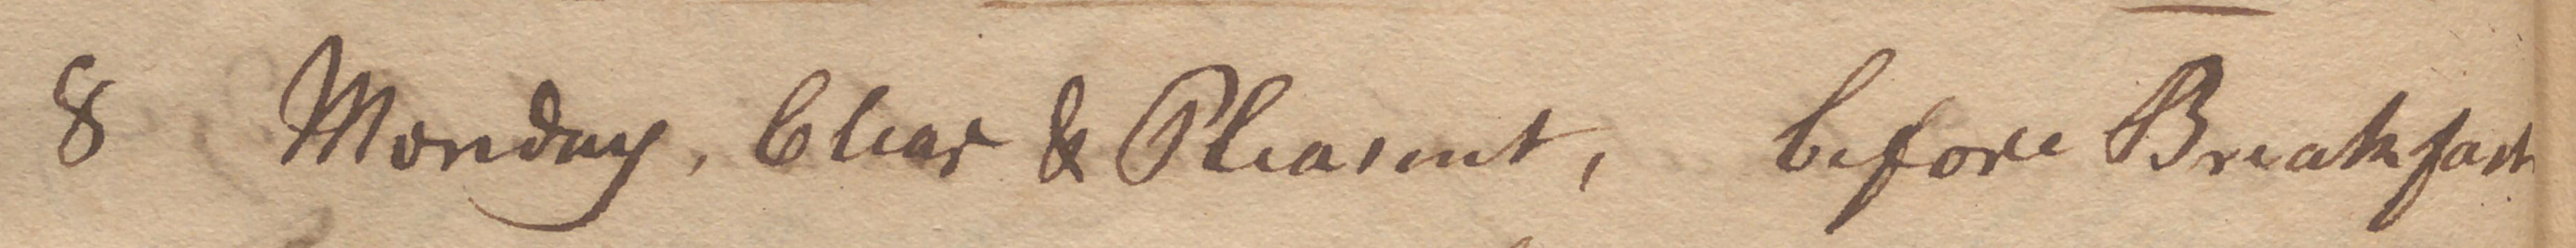8 Monday, Clear & Pleasent, before Breakfast
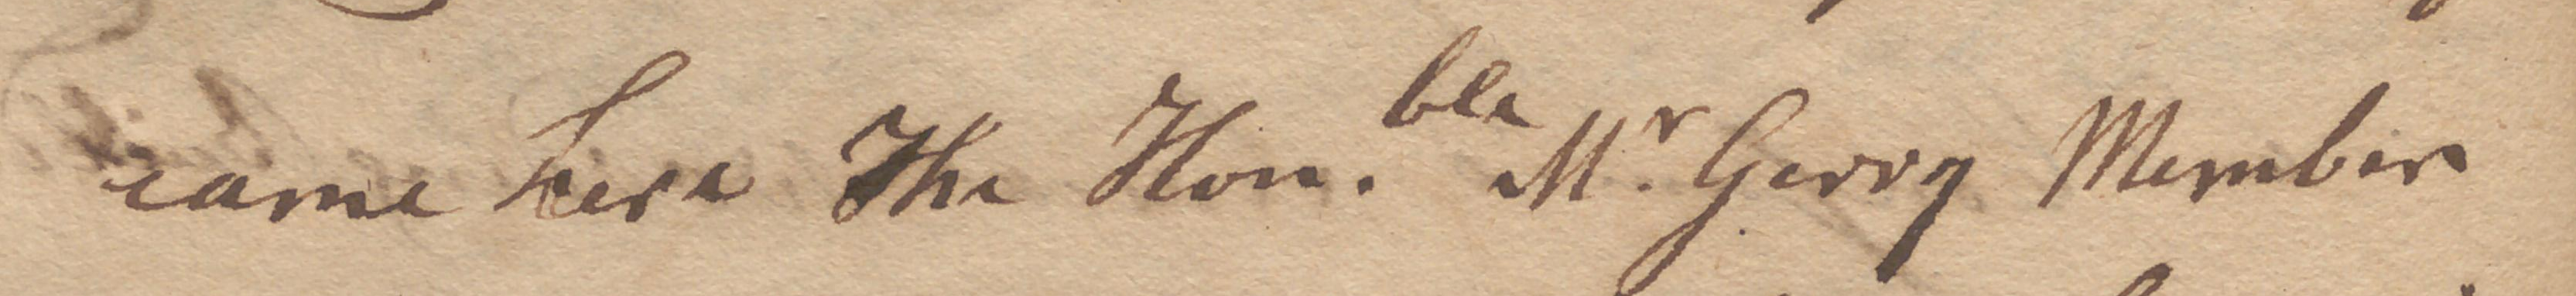came here The Hon^ble. M^r. Gerry Member
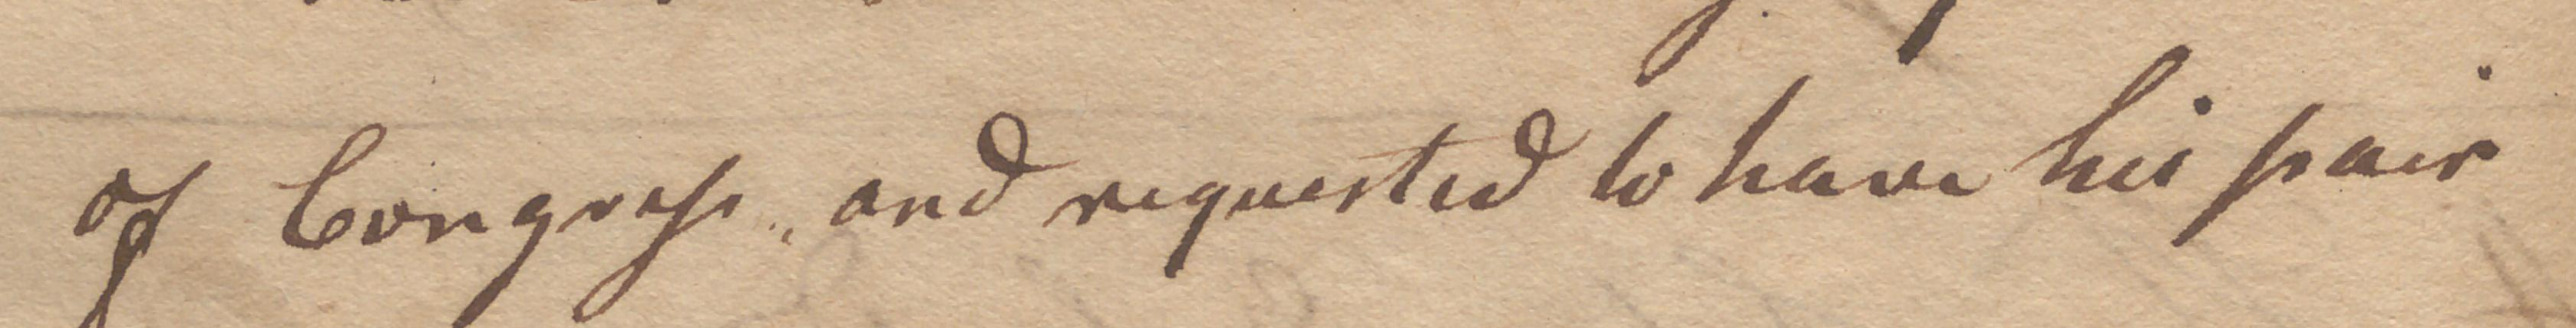of Congress and requested to have his pair
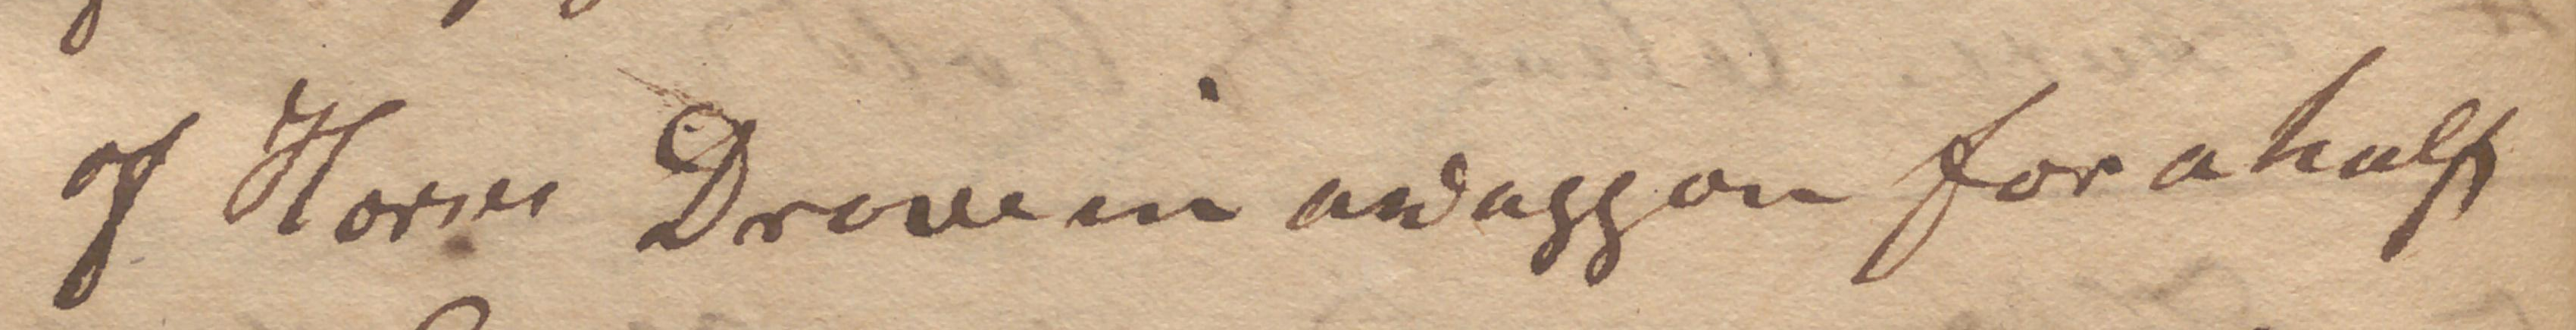of Horses Drove in a waggon for a half
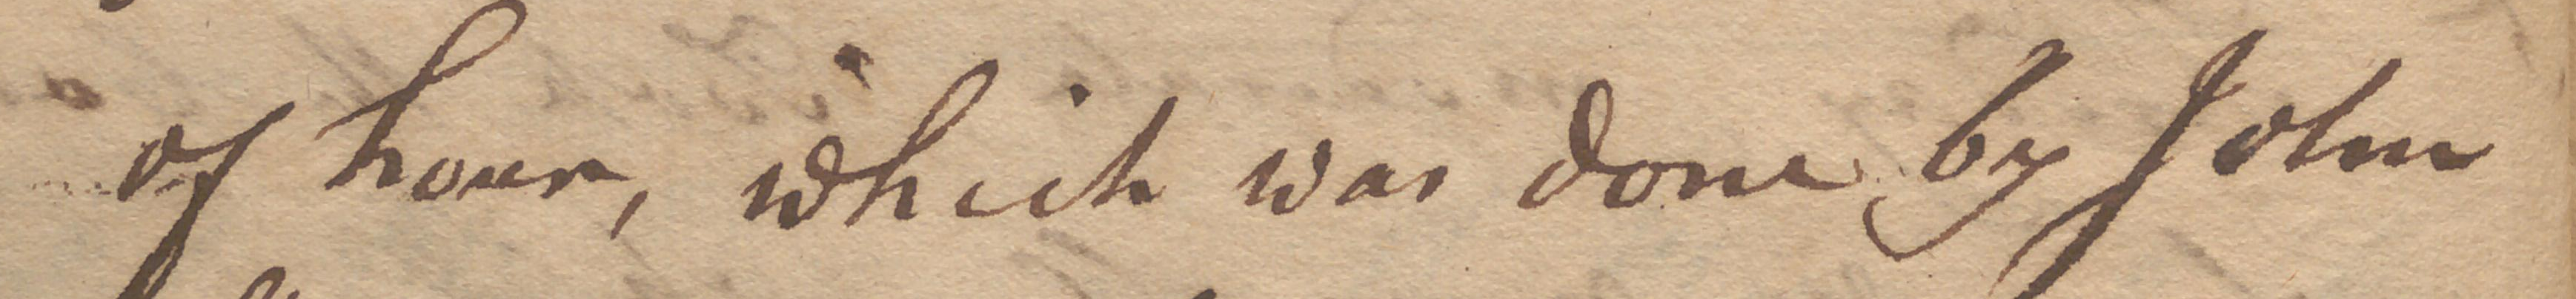of hour, which was done by John
